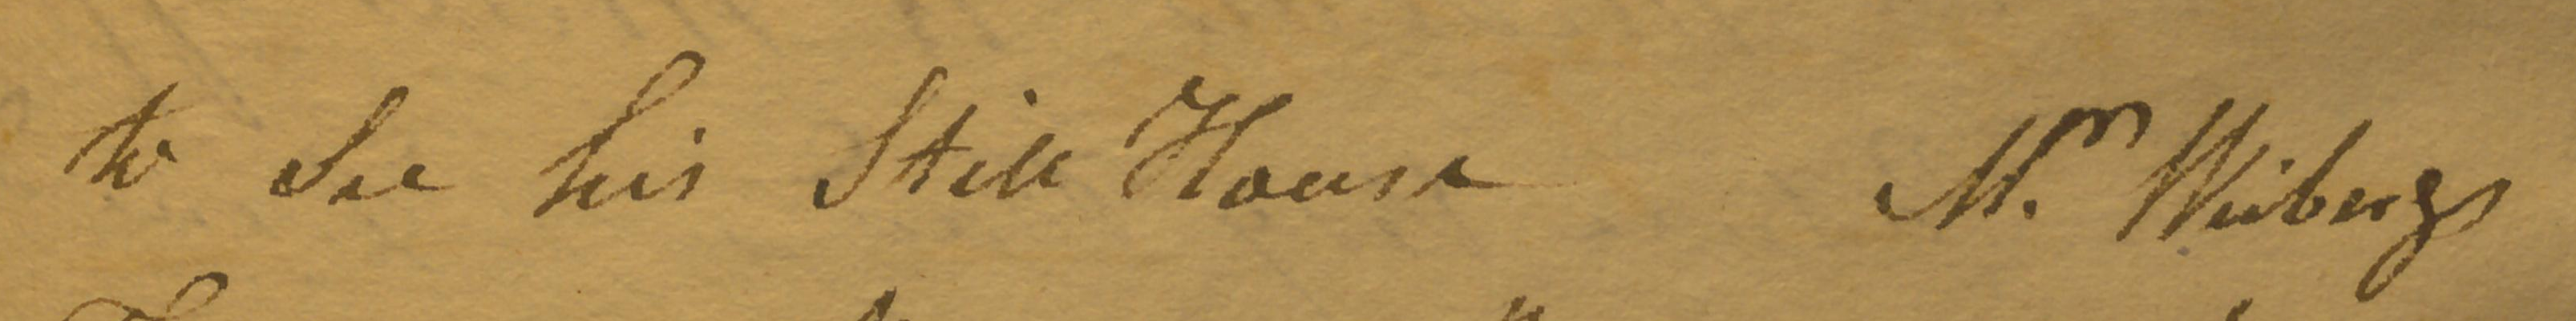to see his Still House M^r. Weibergs
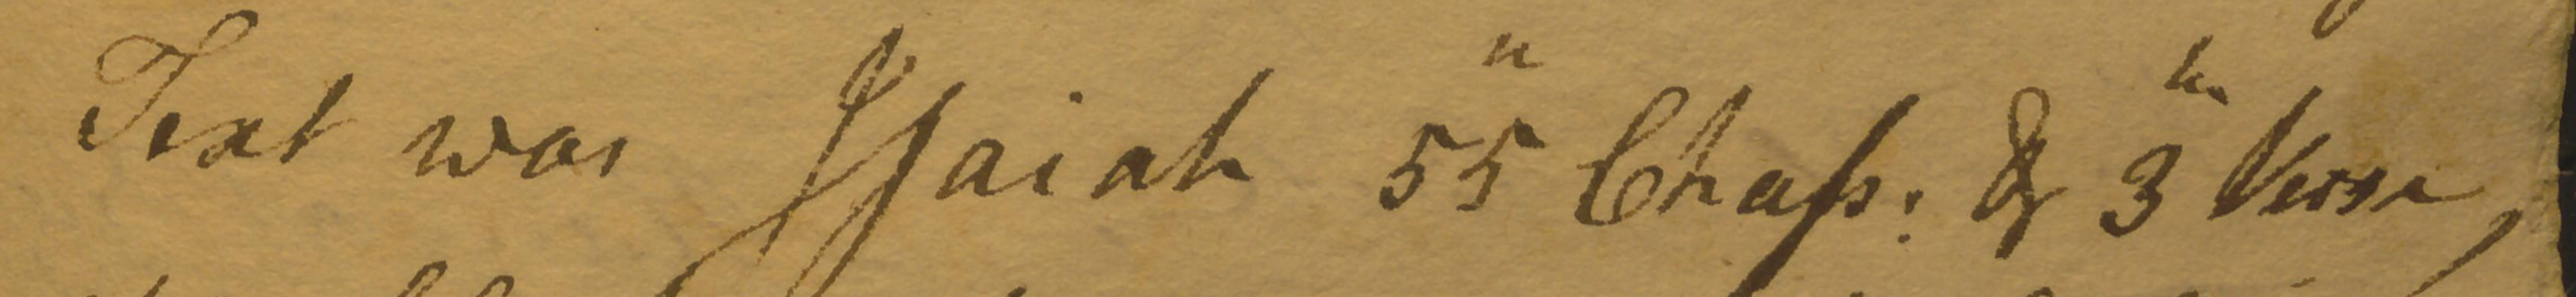Isaiah 55^th Chap. & 3^th Verse
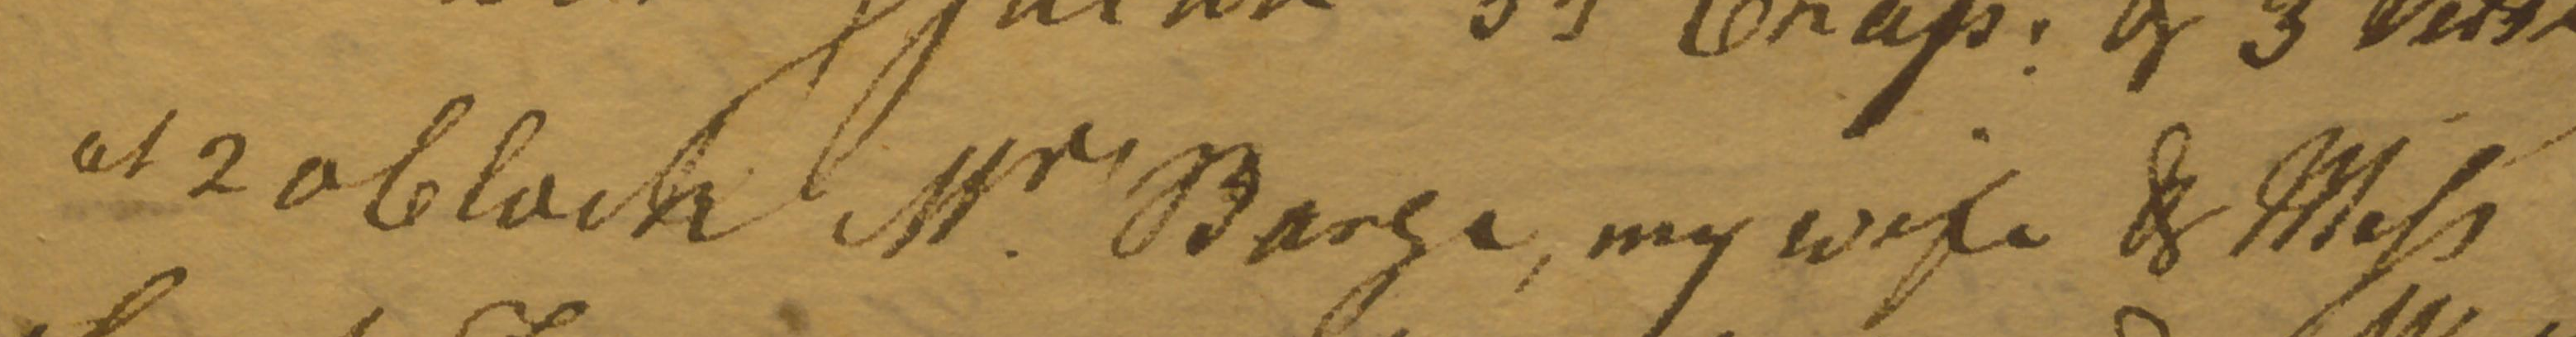at 2 oClock M^rs. Barge, my wife & Miss
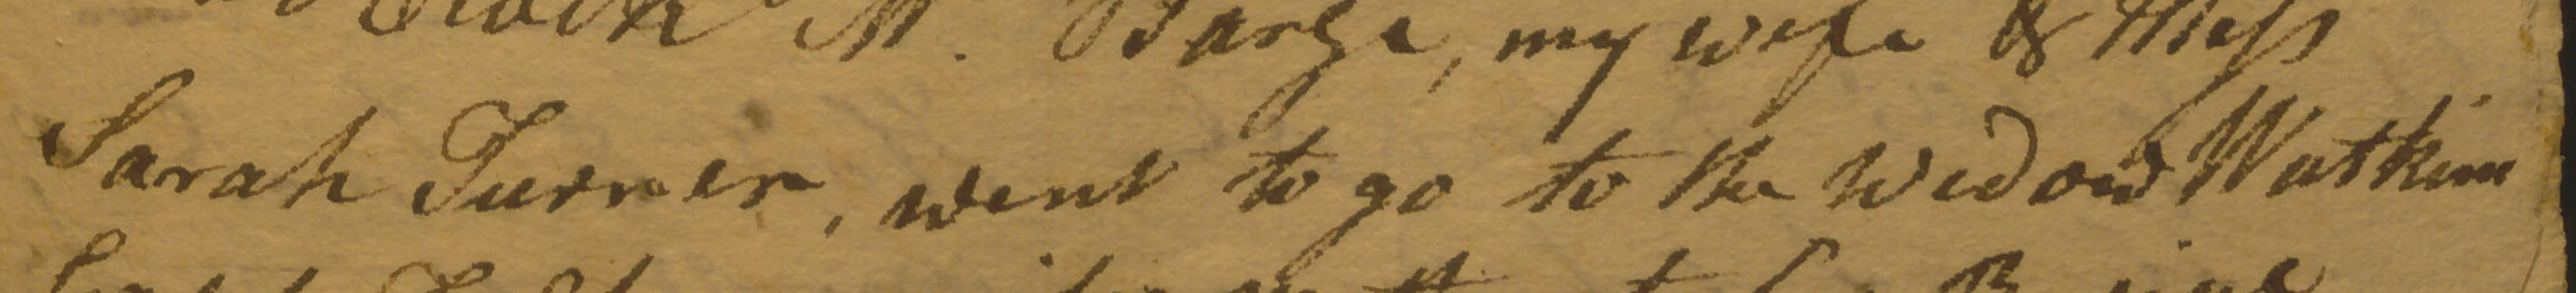Sarah Turner, went to go to the Widow Watkins
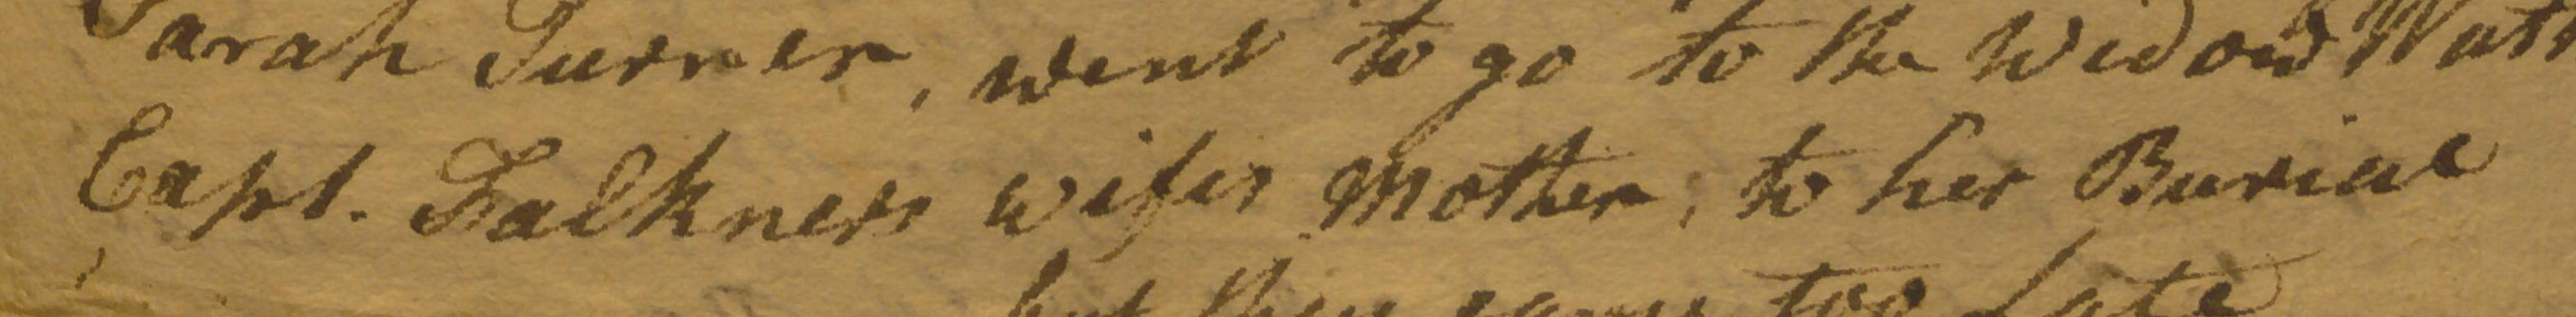Capt. Falkners wites mother, to her Burial
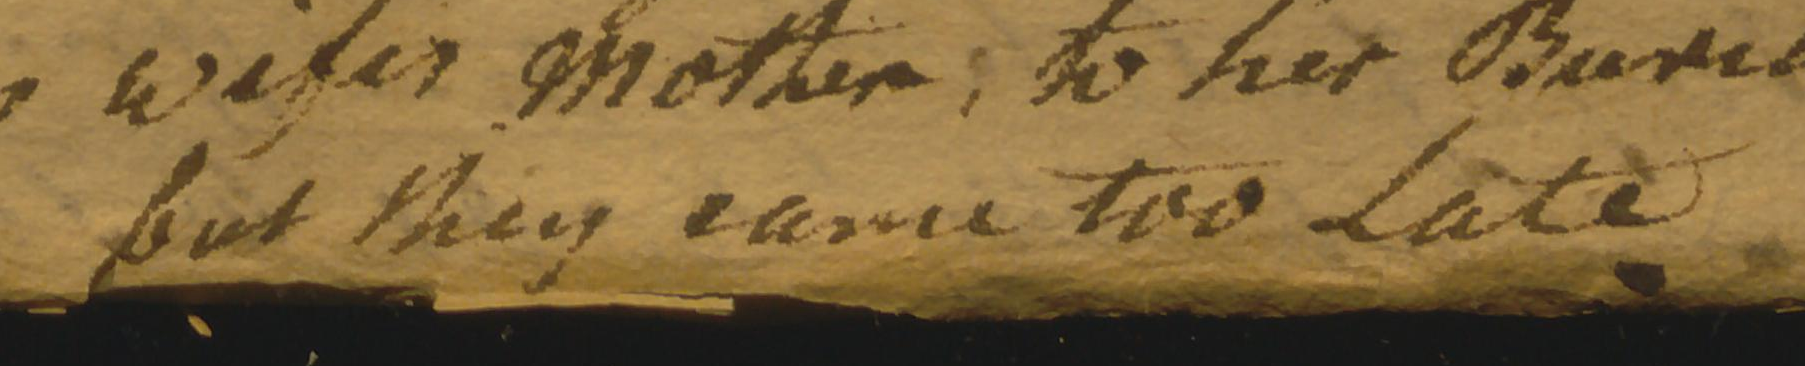but they came too Late
